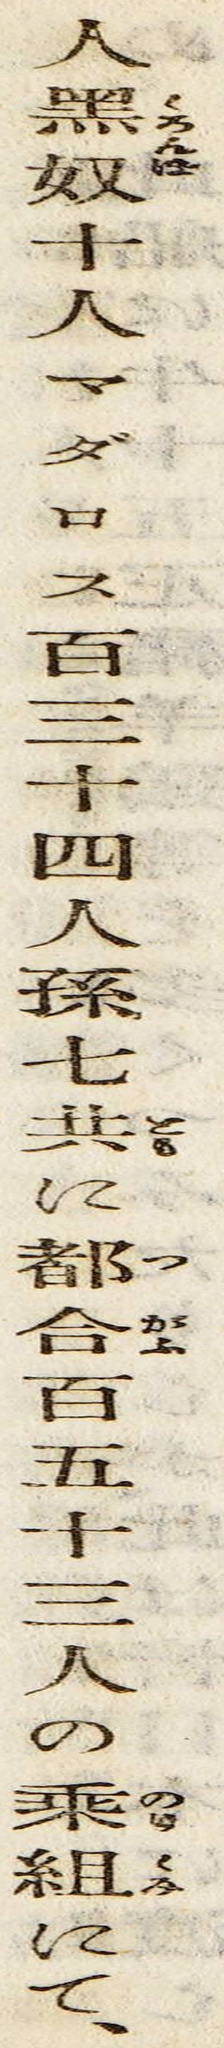人黒奴十人マダロス百三十四人孫七共に都合百五十三人の乗組にて、
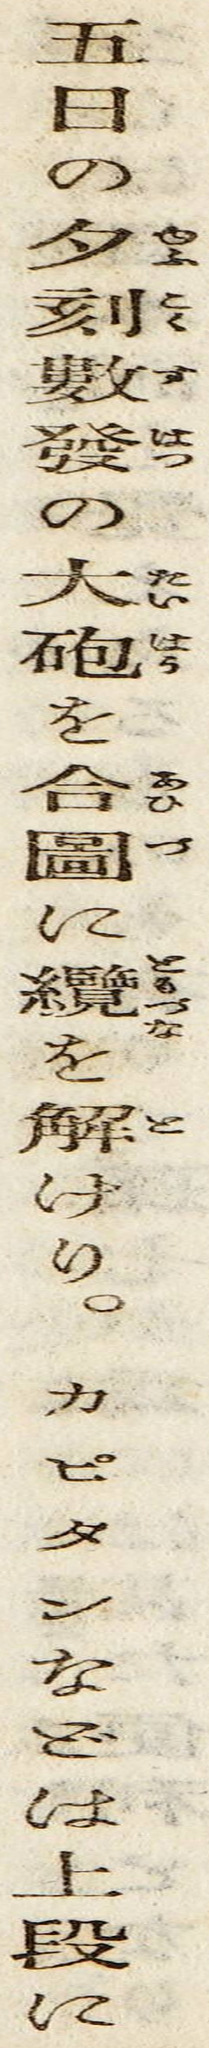五日の夕刻数発の大砲を合図に纜を解けり。カピタンなどは上段に
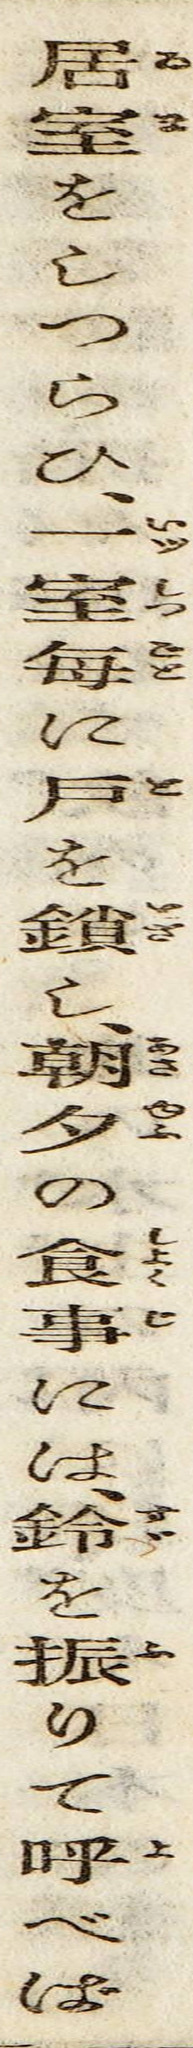居室をしつらひ、一室毎に戸に鎖し、朝夕の食事には、鈴を振りて呼べば
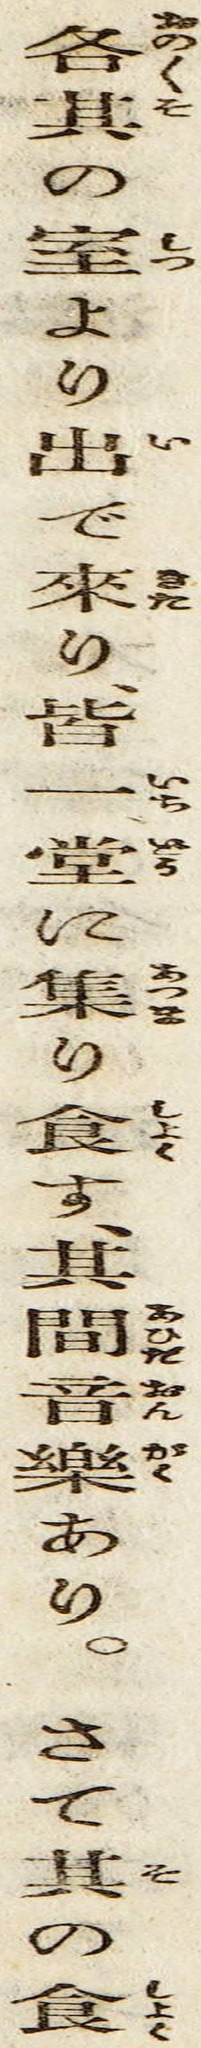各其の室より出で来り、皆一堂に集り食す、其間音楽あり。さて其の食
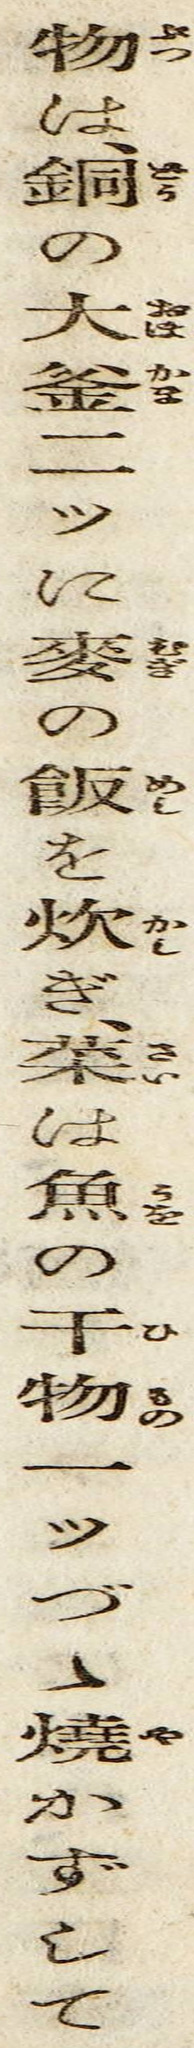物は、銅の大釜二ツに麦の飯を炊ぎ、菜は魚の干物一ツづゝ焼かずして

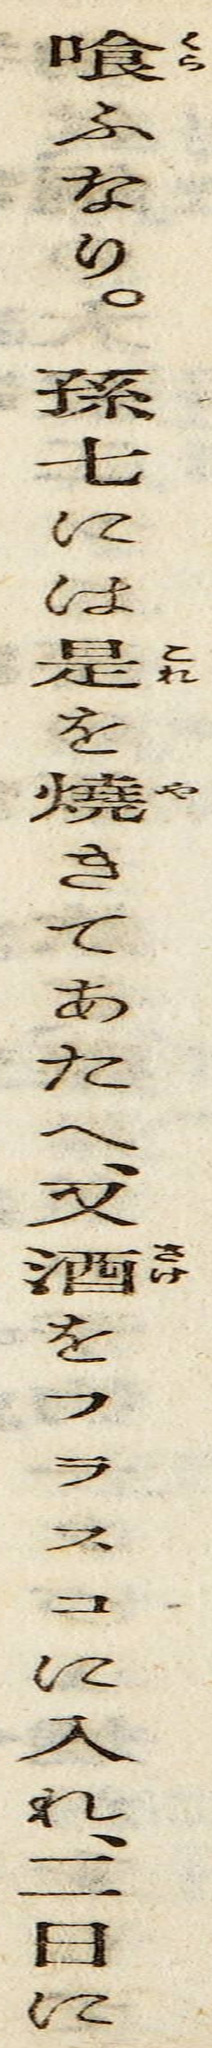喰ふなり。孫七には是を焼きてあたへ、又酒をフラスコに入れ、二日に
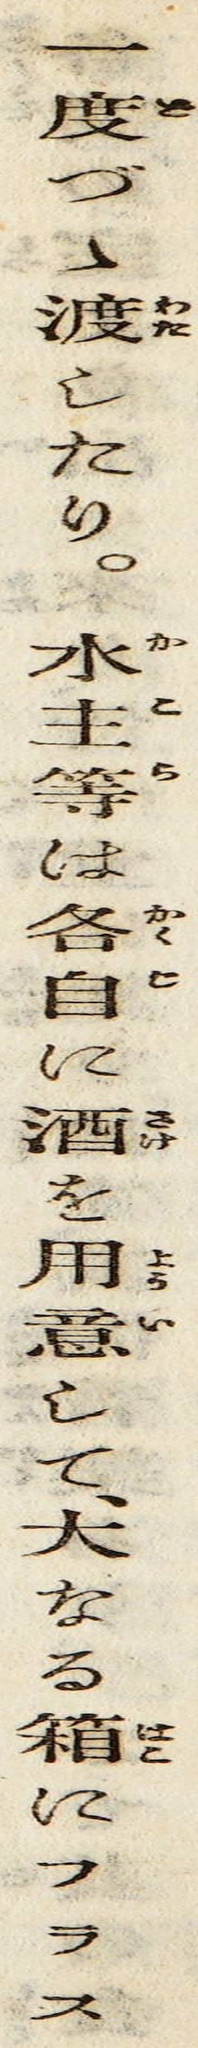一度づゝ渡したり。水主等は各自に酒を用意して、大なる箱にフラス
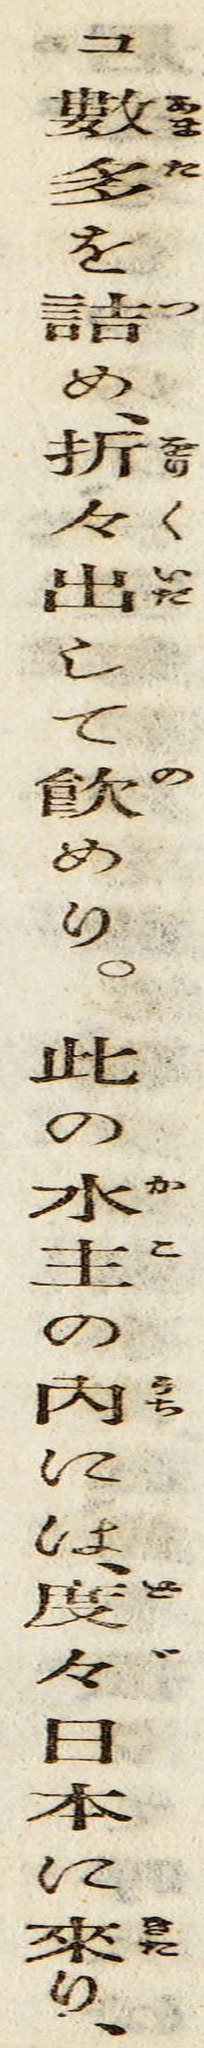コ数多を詰め、折々出して飲めり。此の水主の内には、度々日本に来り、
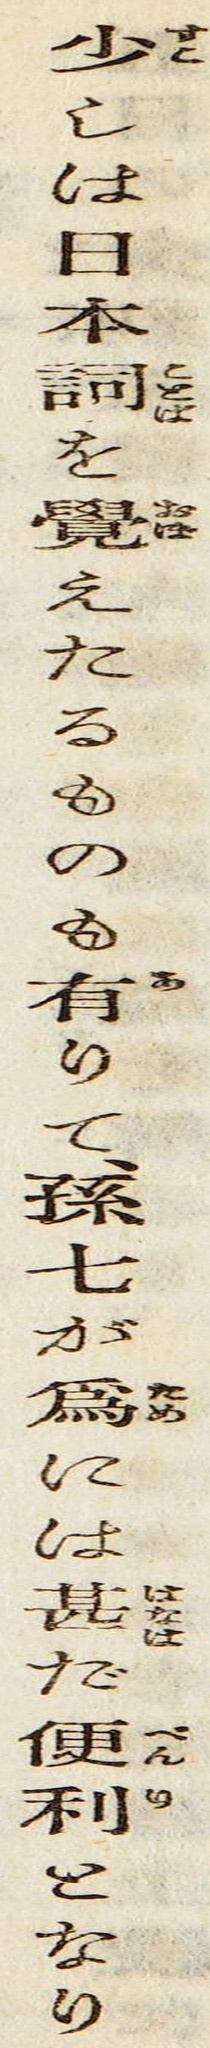少しは日本詞を覚えたるものも有りて、孫七が為には甚だ便利となり
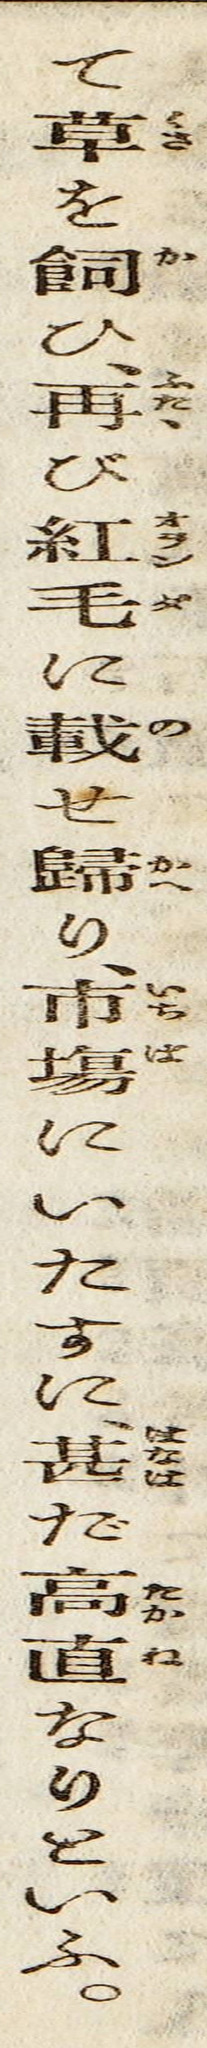て草を飼ひ、再び紅毛に載せ帰り、市場にいたすに、甚だ高直なりといふ。
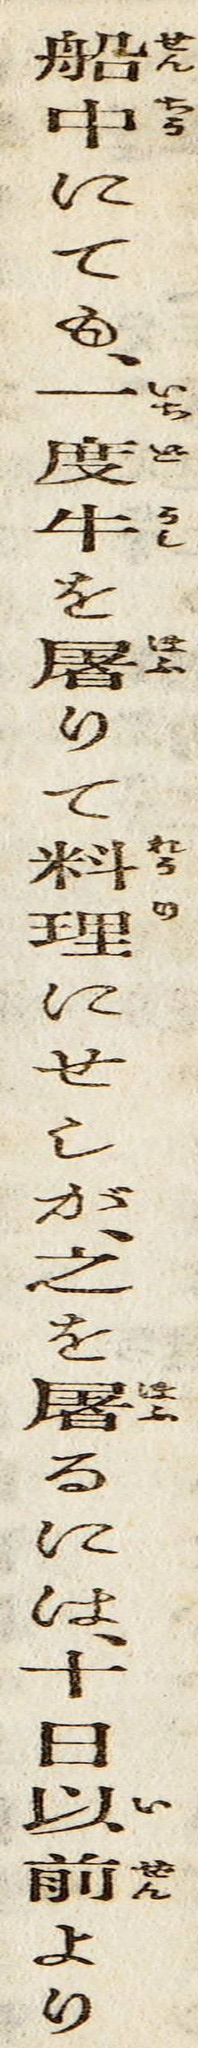船中にても、一度牛を屠りて料理にせしが、之を屠るには、十日以前より
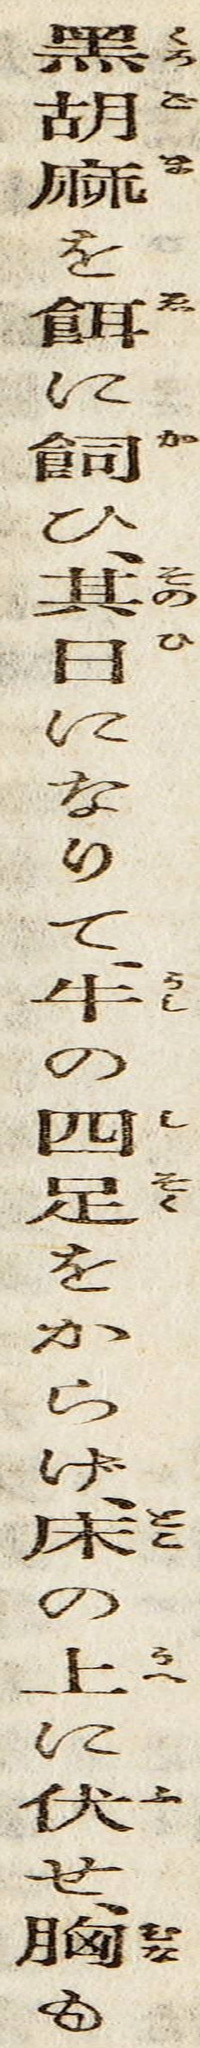黒胡麻を餌に飼ひ、其日になりて、牛の四足をからげ、床の上に伏せ、胸も
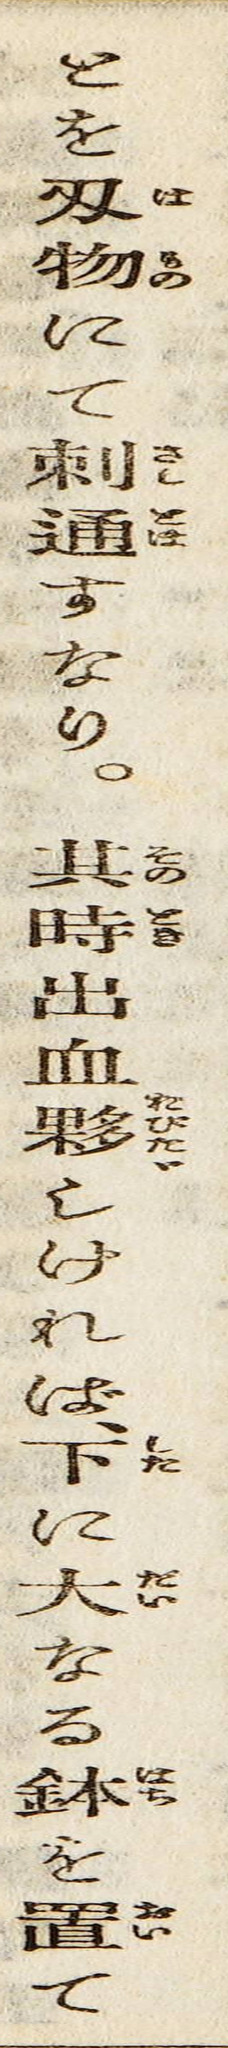とを刃物にて刺通すなり。其時出血夥しければ、下に大なる鉢を置て
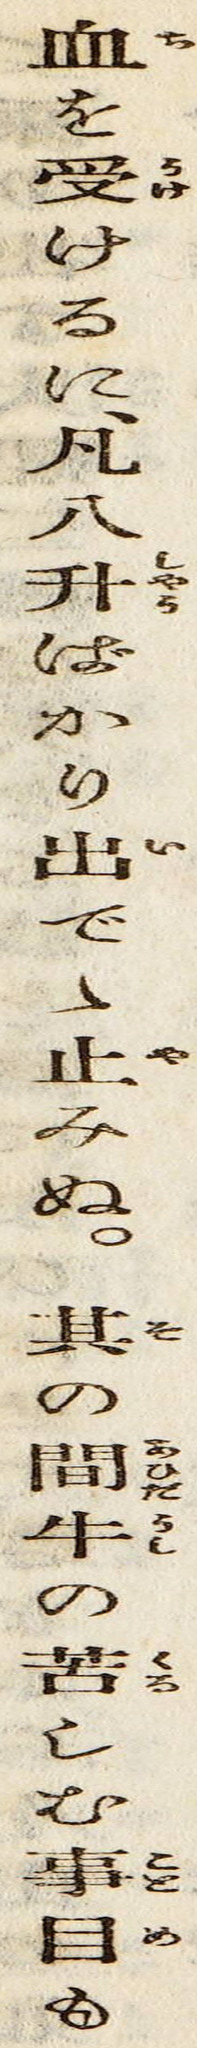血を受けるに、凡八升ばかりででゝ止みぬ。其の間牛の苦しむ事目も
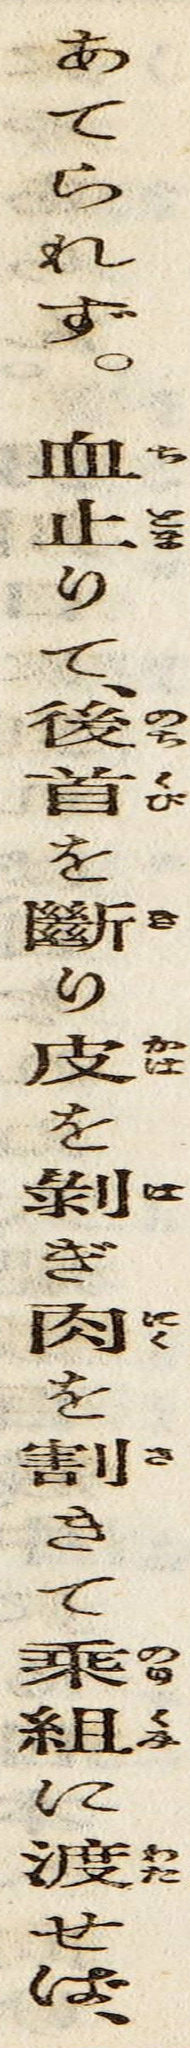あてられず。血止りて、後首を断り皮を剥ぎ肉を割きて乗組に渡せば、
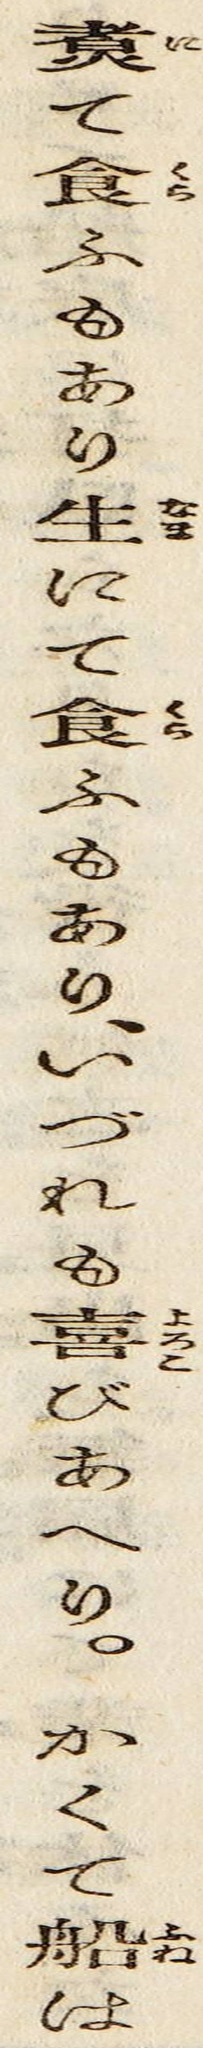煮て食ふもあり生にて食ふもあり、いづれも喜びあへり。かくて船は
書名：日本漂流譚
